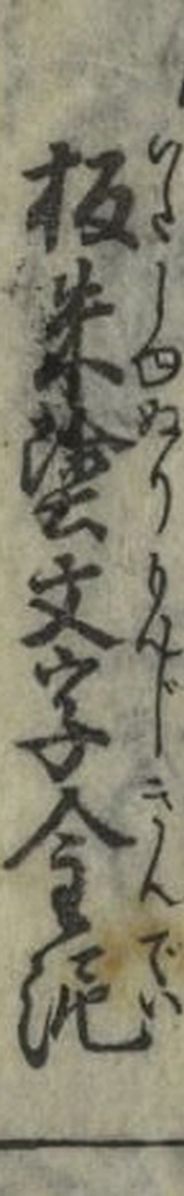板朱塗文字金泥

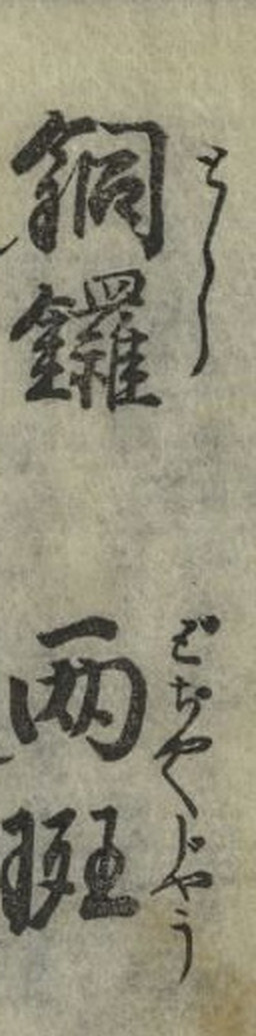銅鑼両班
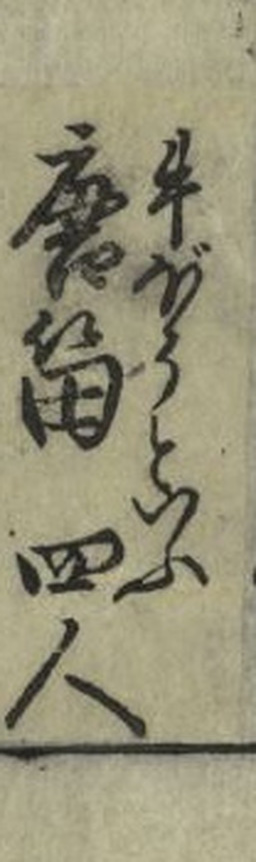唐笛四人
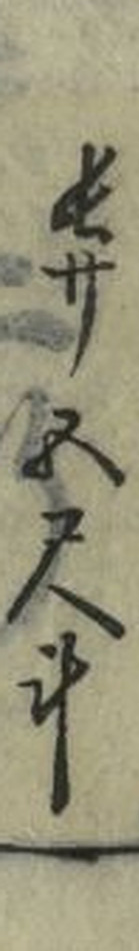長さ五尺半
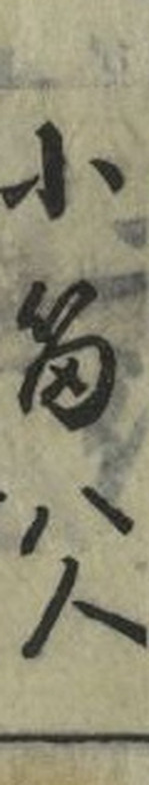小笛八人
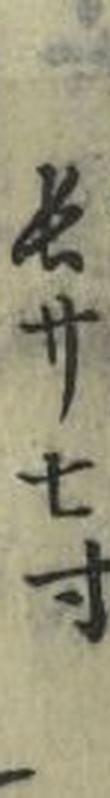長さ七寸
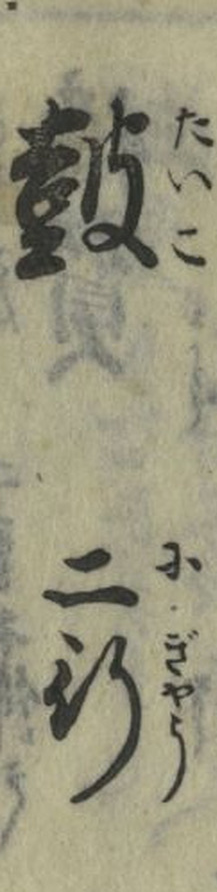鼓二行
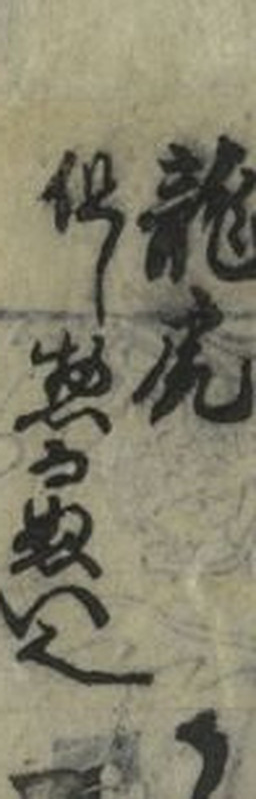但し惣而ぬい也
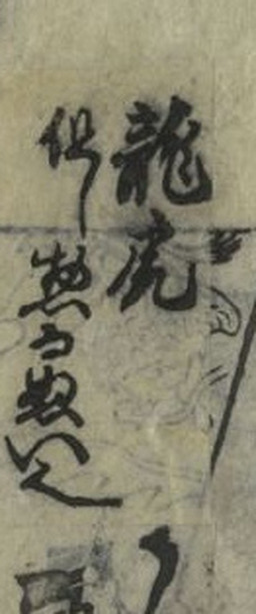但し惣而ぬい也
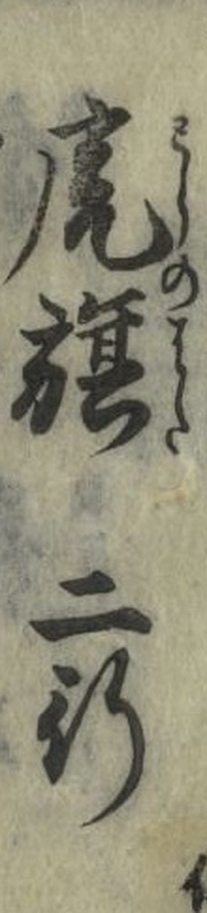虎旗二行

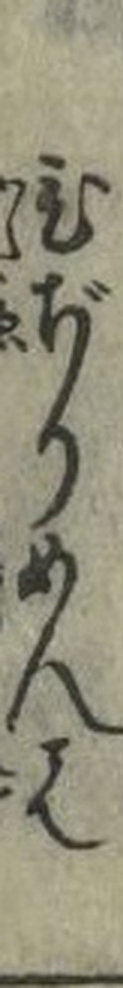ひぢりめんは
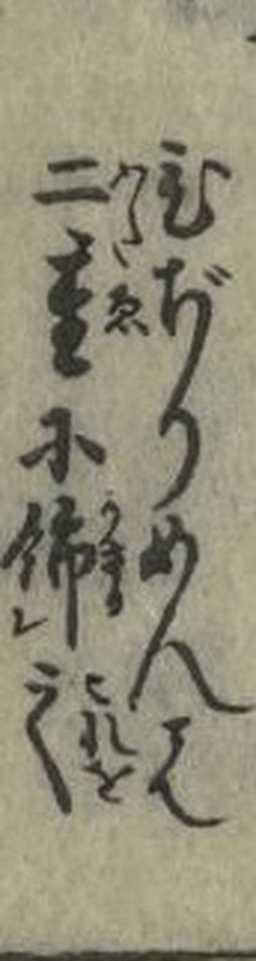二重に飾之
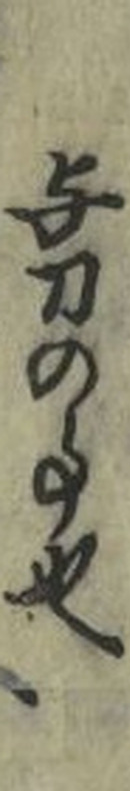与力の事也
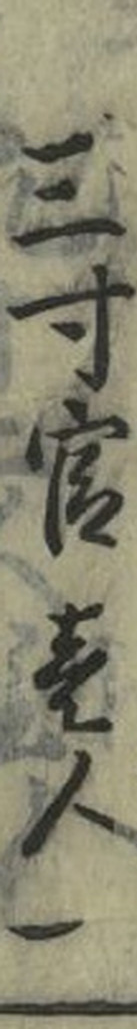三寸官壱人
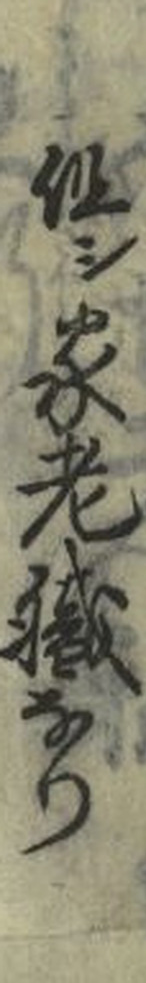但し家老職なり
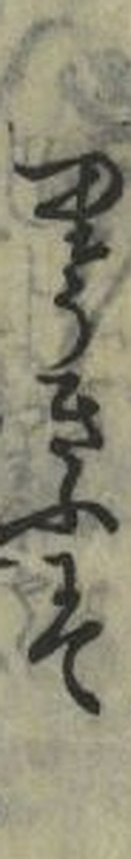りうきふにて
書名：琉球人大行列記
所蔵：University of the Ryukyus Library
